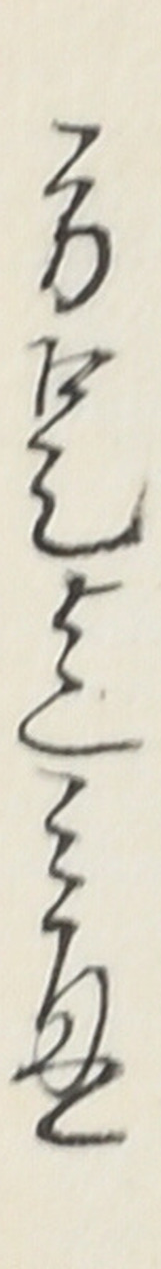方是迄之通

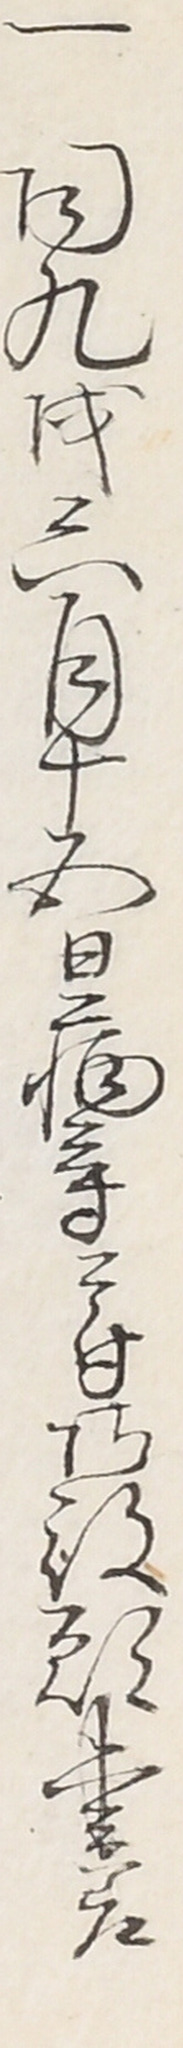一同九戌六月十五日病気ニ付御役願書差
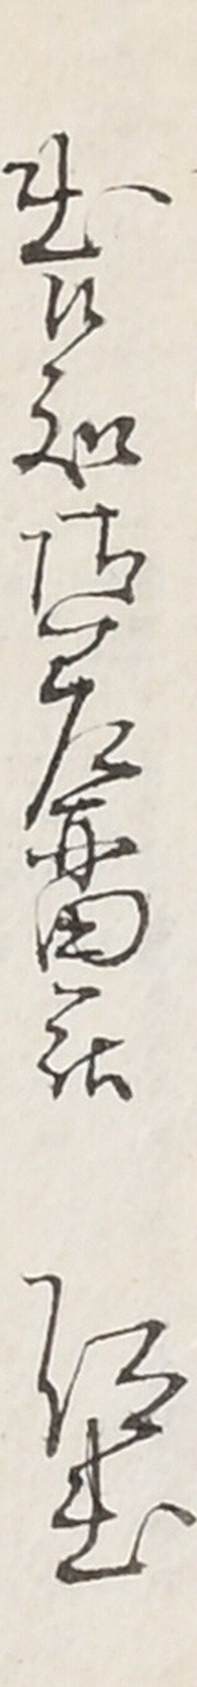出候処御差留被仰出
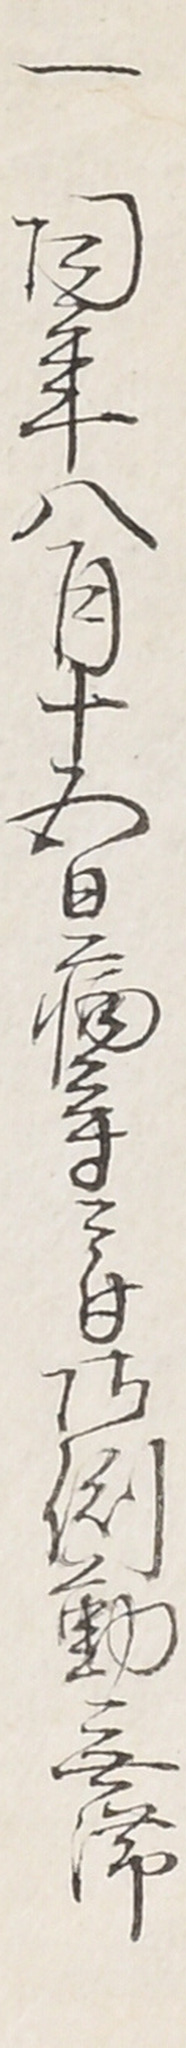一同年八月十五日病気ニ付御側勤無滞
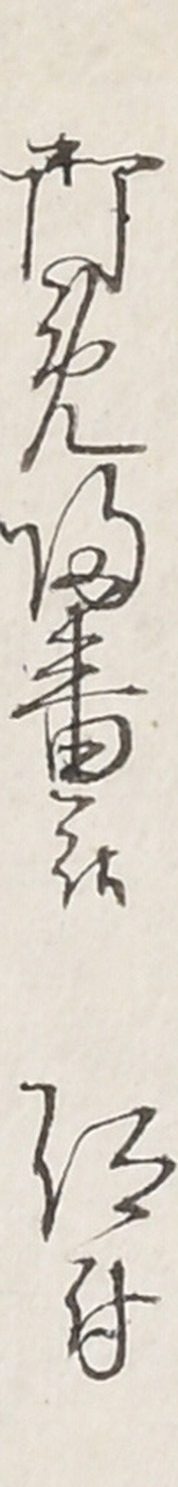御免帰番被仰付
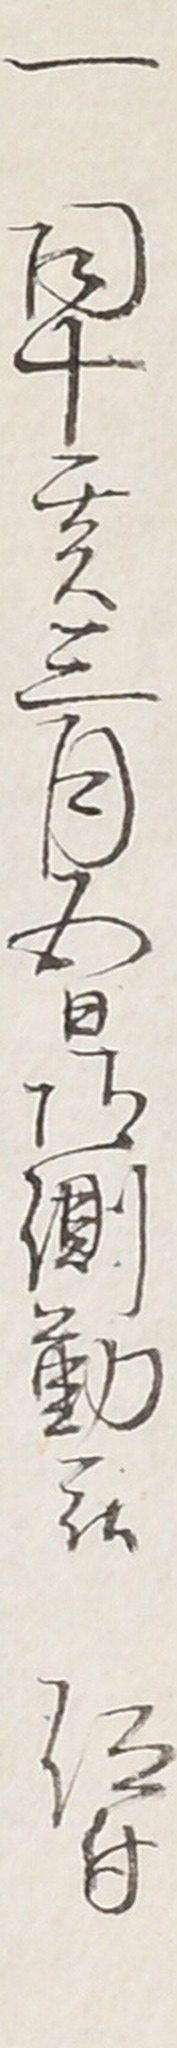一同十亥三月五日御側勤被仰付
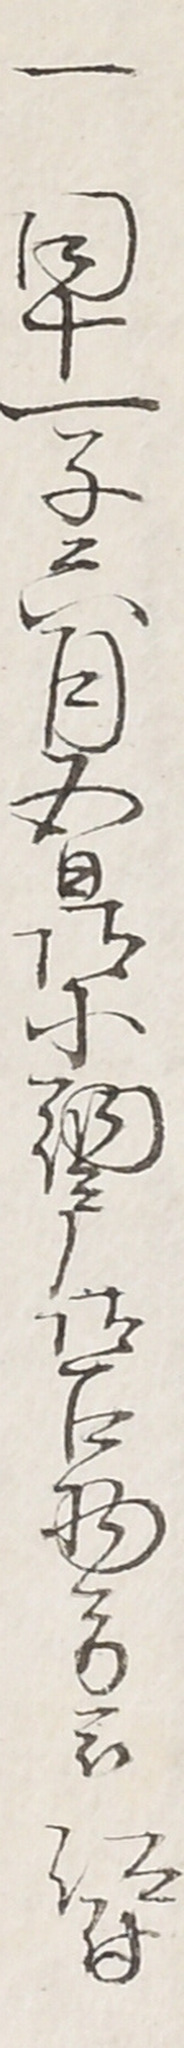一同十一子六月五日御小納戸御召物方被仰付
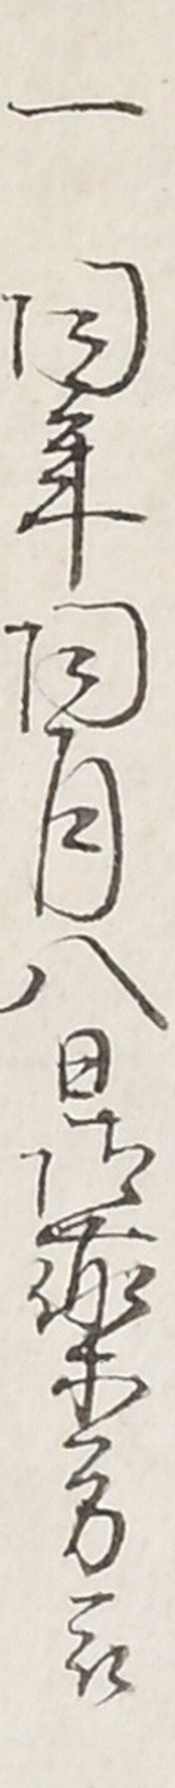一同年同月八日御薬方被仰付
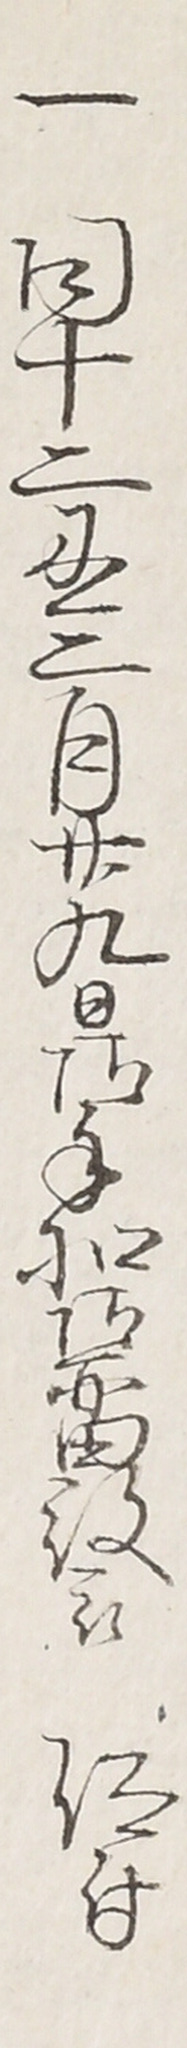一同十二丑三月廿九日御手控御留役被仰付
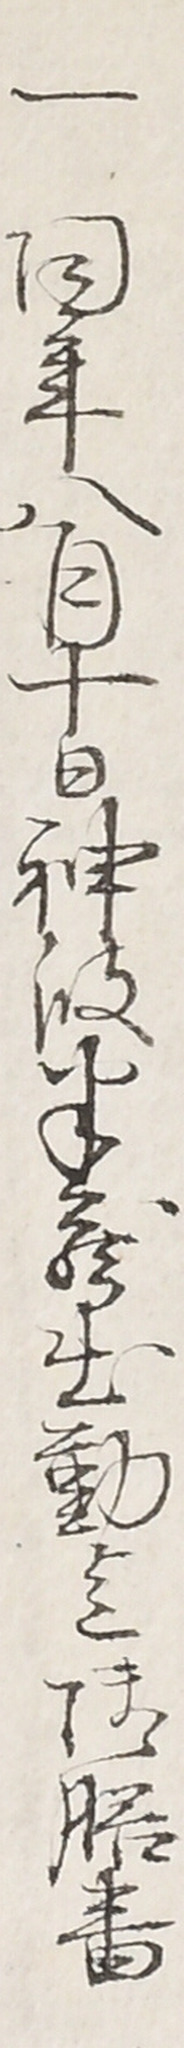一同年八月十日神岐半蔵出勤迄御膳番
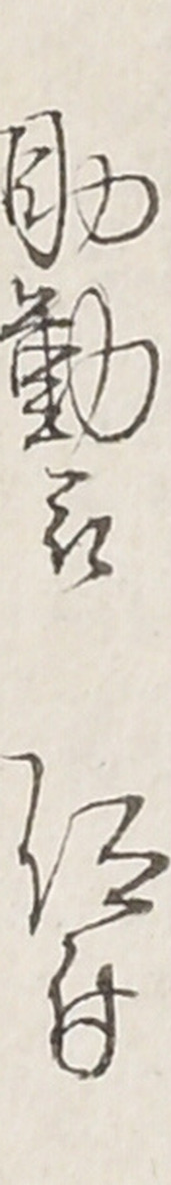助勤被仰付
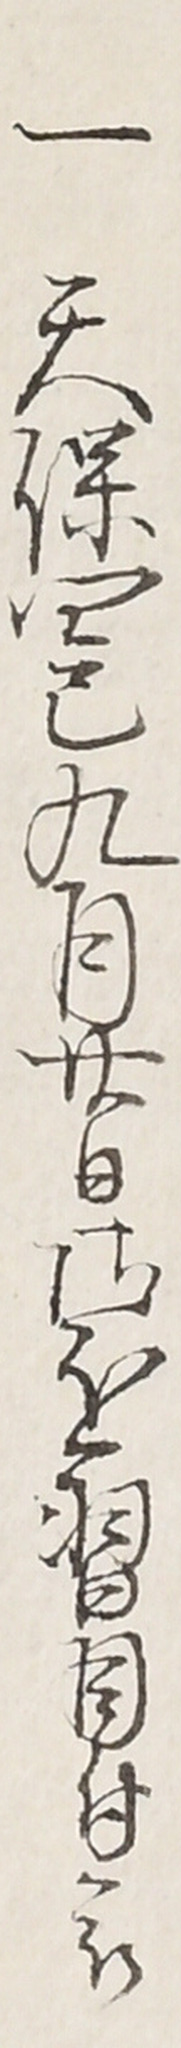一天保四巳九月廿日御進習目付被
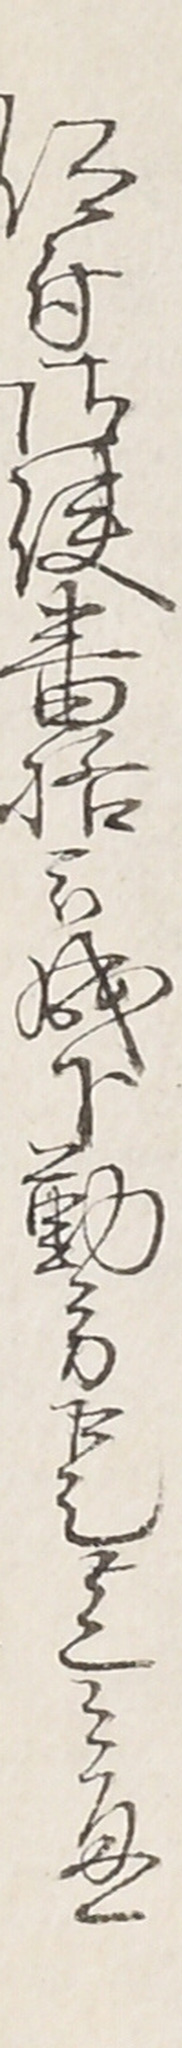仰付御使番格被成下勤方是迄之通
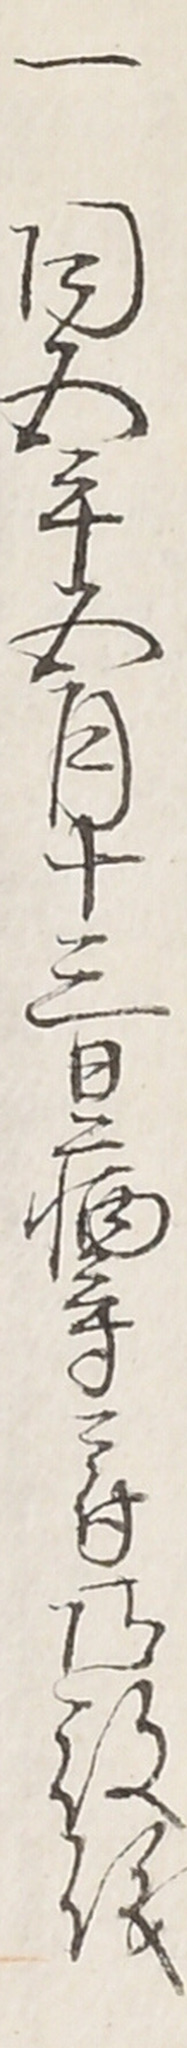一同五午五月十三日病気ニ付御役儀
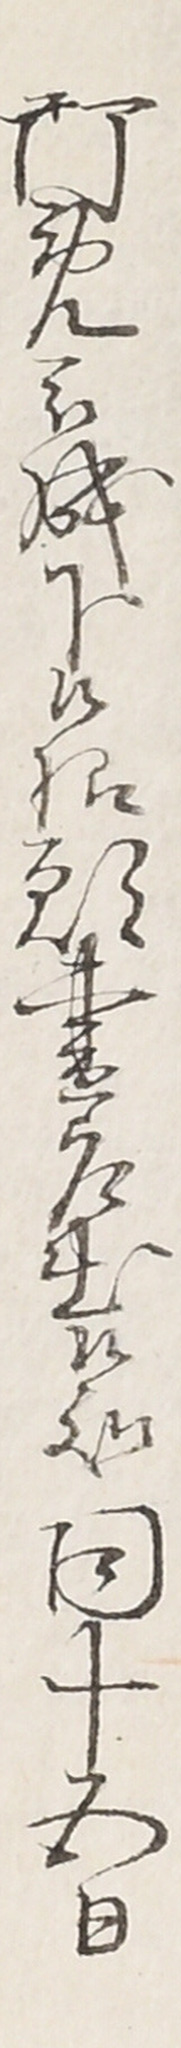御免被成下候様願書差出候処同十五日
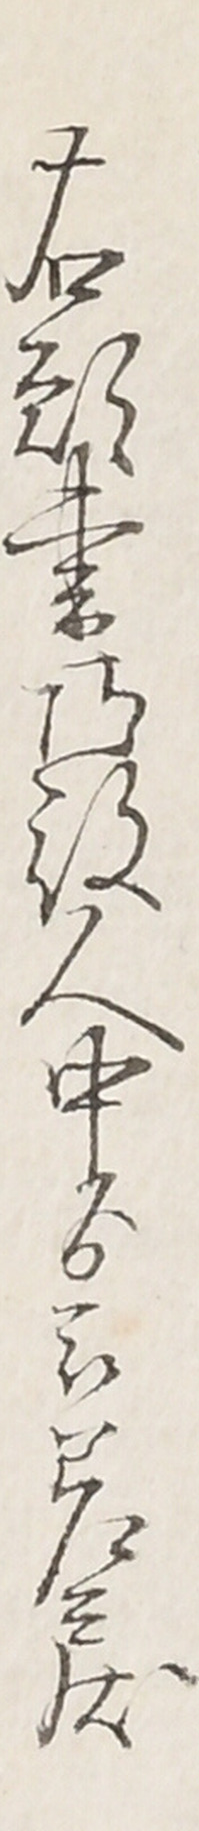右願書御役人中ゟ被差戻
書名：給人諸士勤仕録（七）
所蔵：伊那市立高遠町図書館・合同会社AMANE
